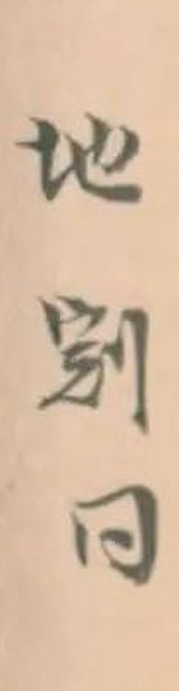地割同
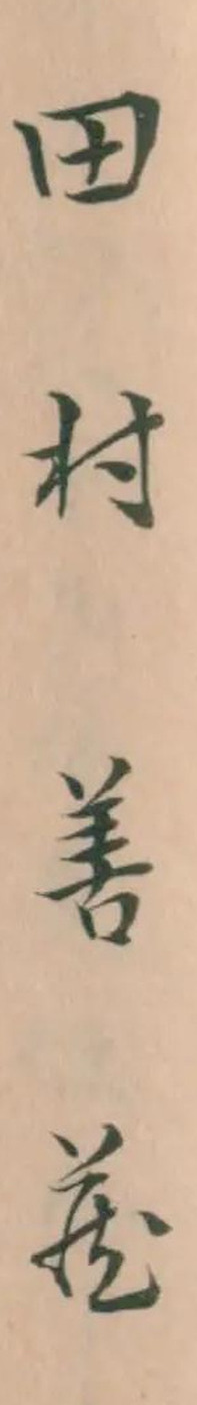田村善蔵
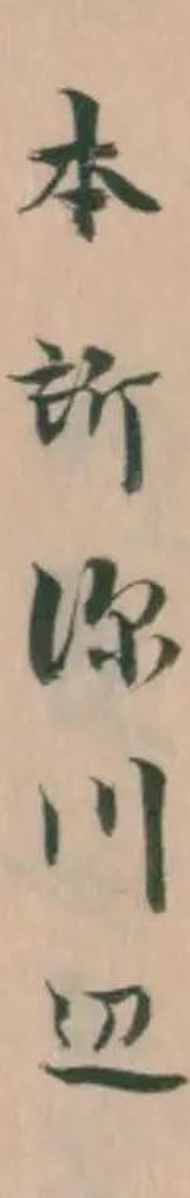本所深川辺
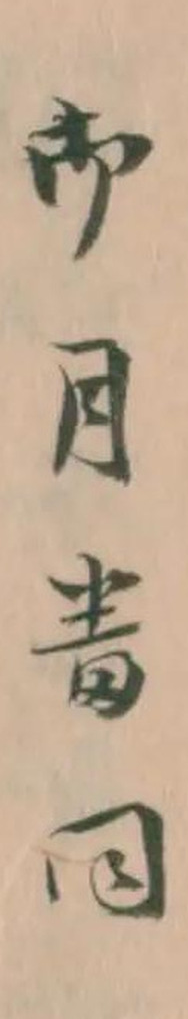御月番同
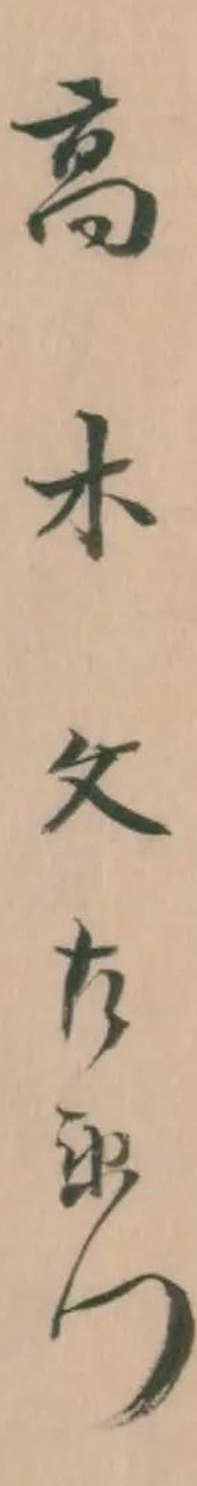高木文左衛門
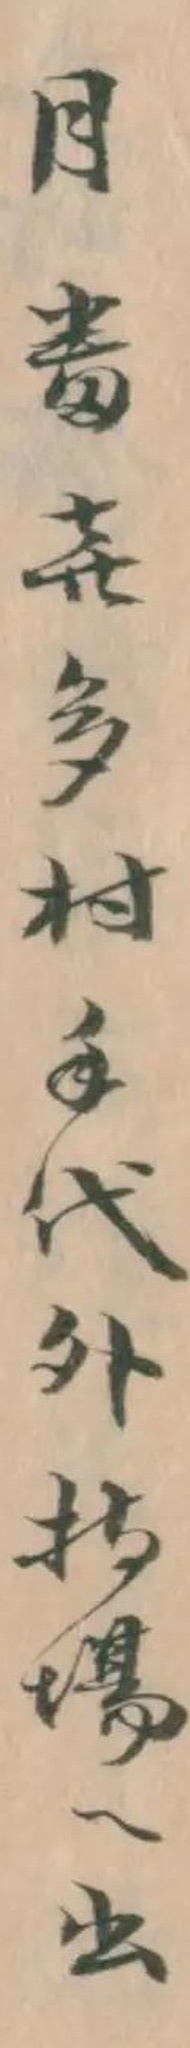月番喜多村手代外持場へ出
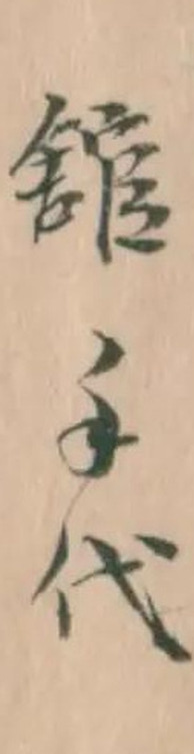舘手代
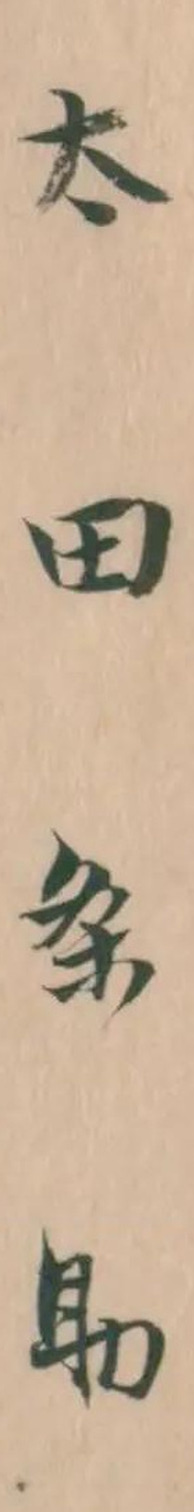太田条助
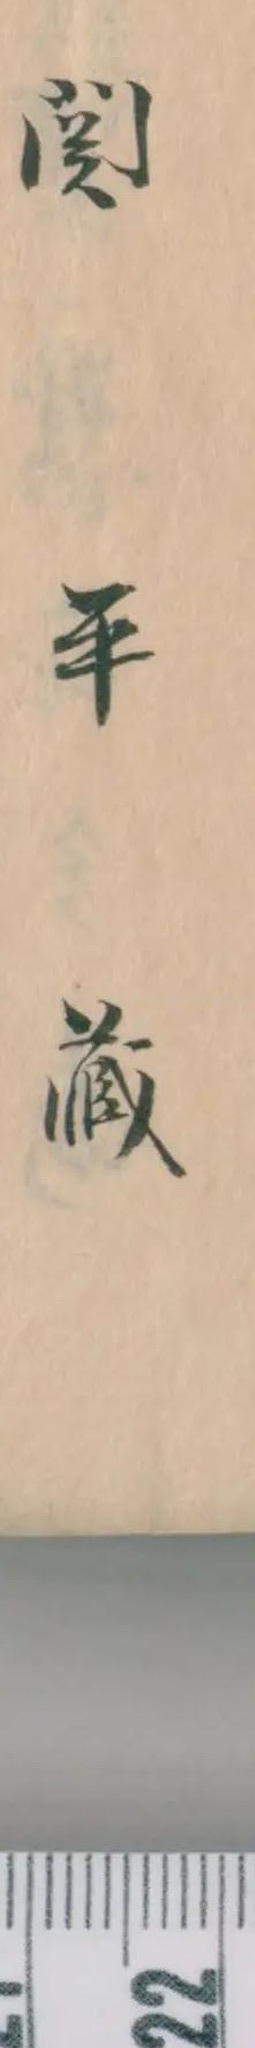関平藏
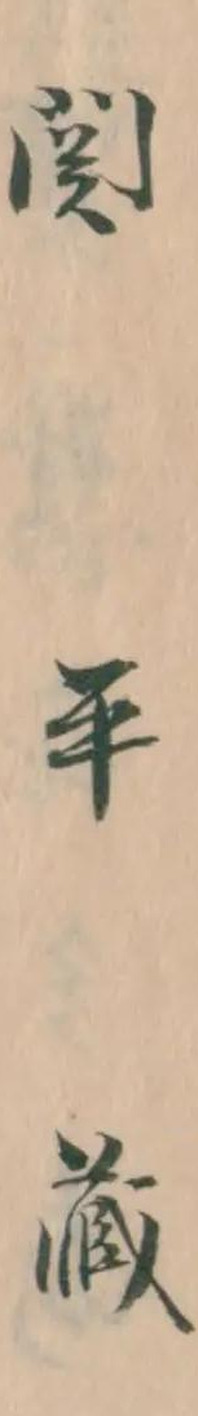関平藏

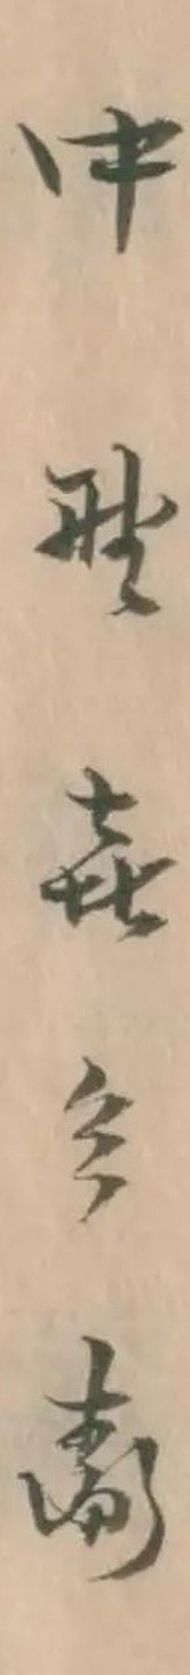中野喜兵衛
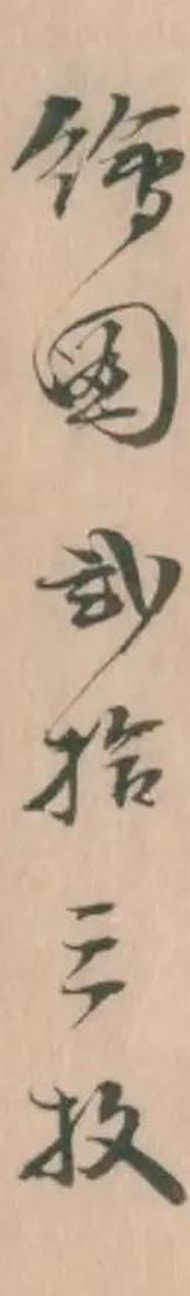絵図弐拾三枚
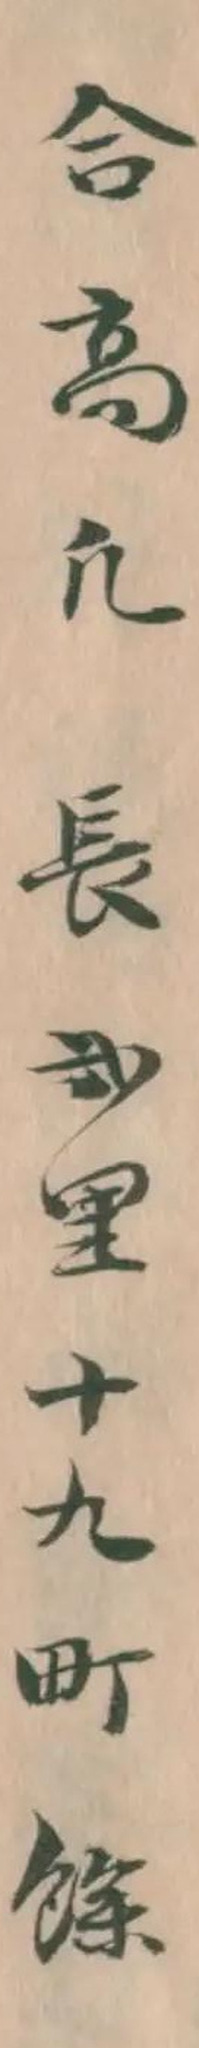合高凡長弐里十九町余
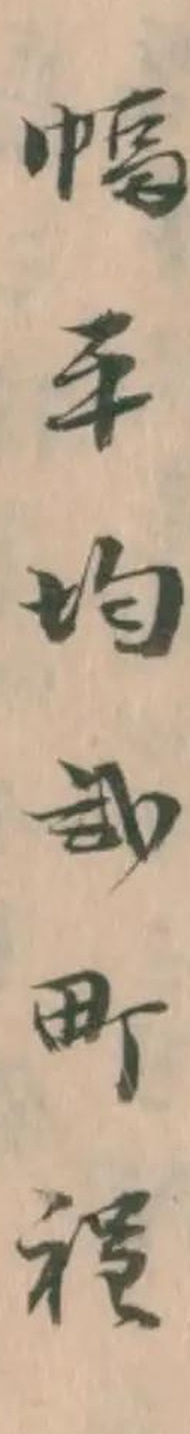幅平均弐町程
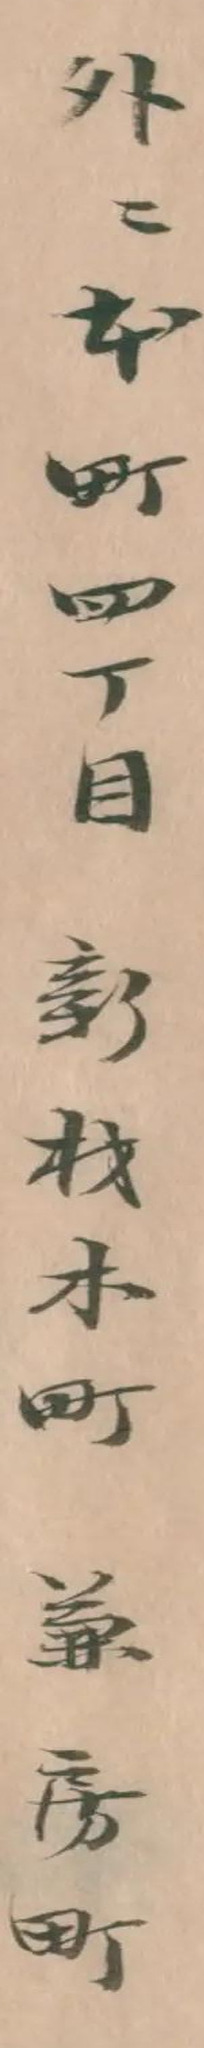外に本町四丁目新材木町兼房町
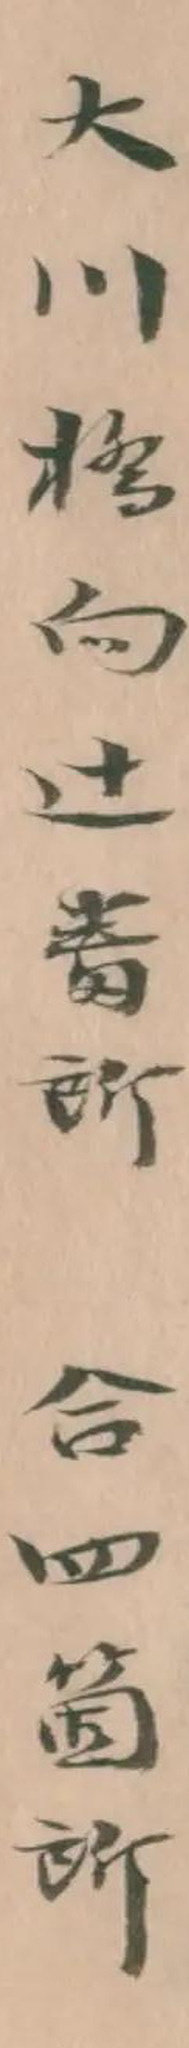大川橋向辻番所合四箇所
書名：地災撮要. 巻7-9(地震之部)
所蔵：国立国会図書館 National Diet Library, JAPAN
